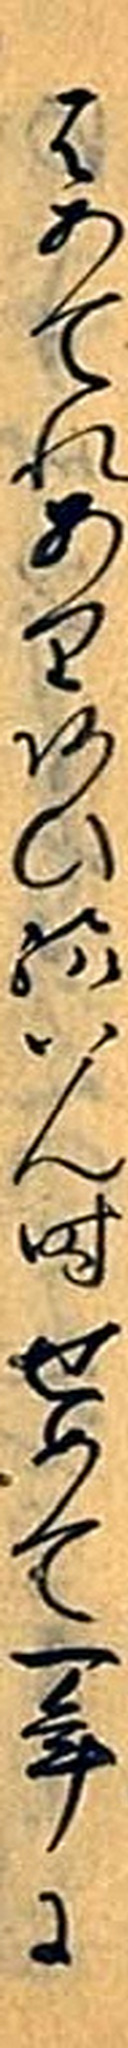はあてれありあひ給はん時せめて一年に
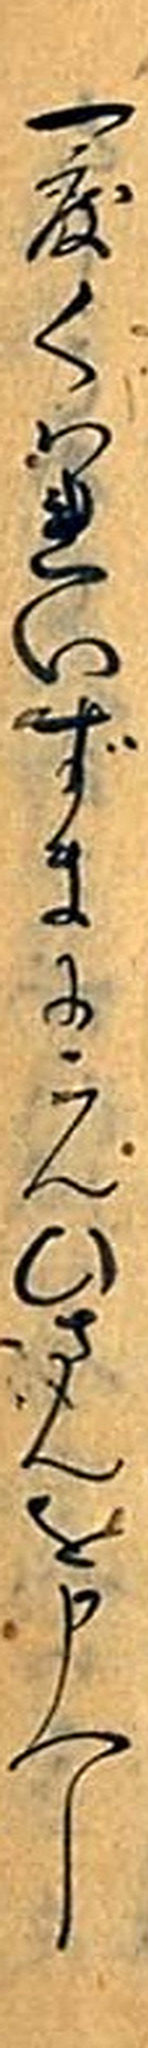一度くはれいずまにこんひさんを申へし

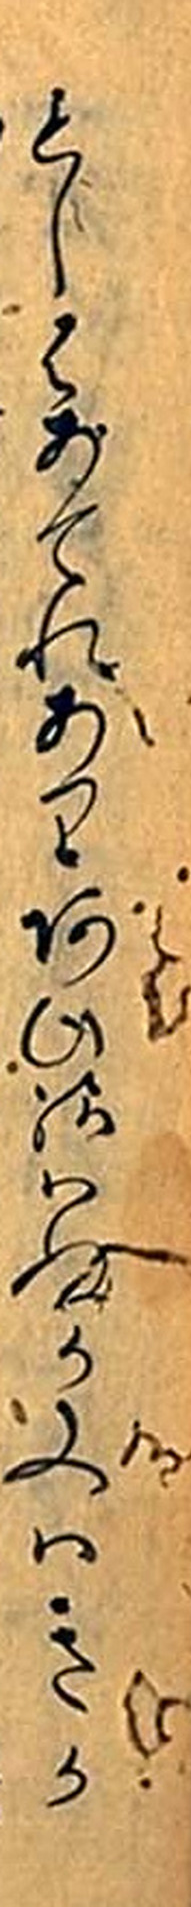もしはあてれありあひ給はぬか又はきか
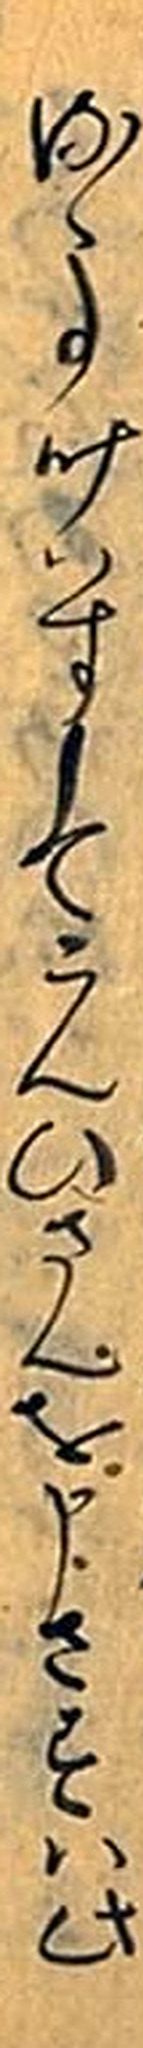るゝ事叶はすしてこんひさんを申さすは此
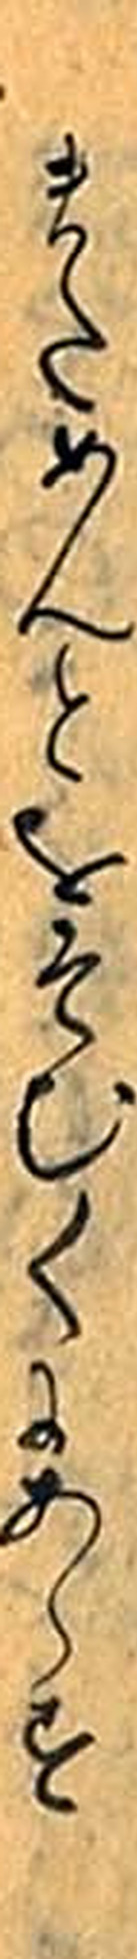まためんとをそむくにあらす
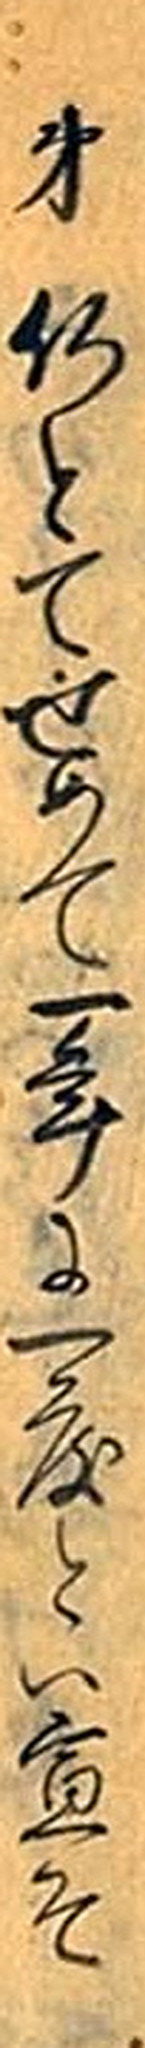弟何とてせめて一年に一度とは宣そ
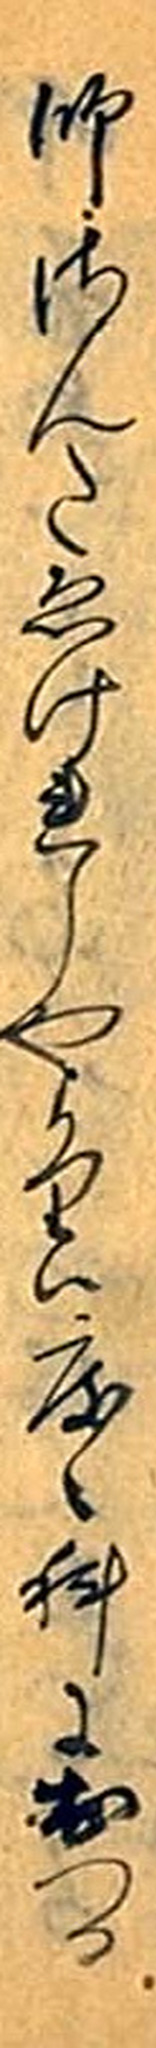師さんたゑけれしやよりは度々科におつる
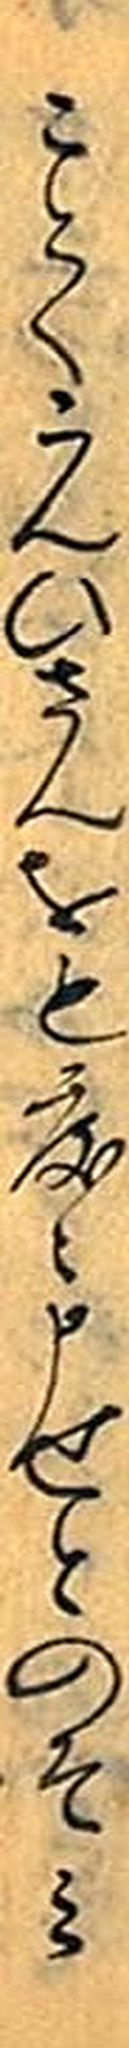ことくこんひさんをも度々申せとのそみ
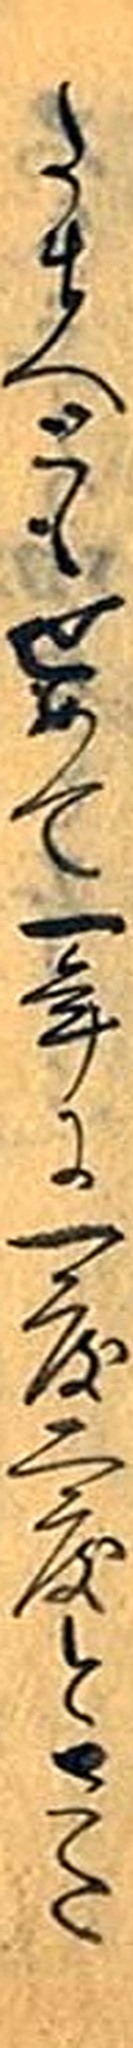たまへともせめて一年に一度二度とさた
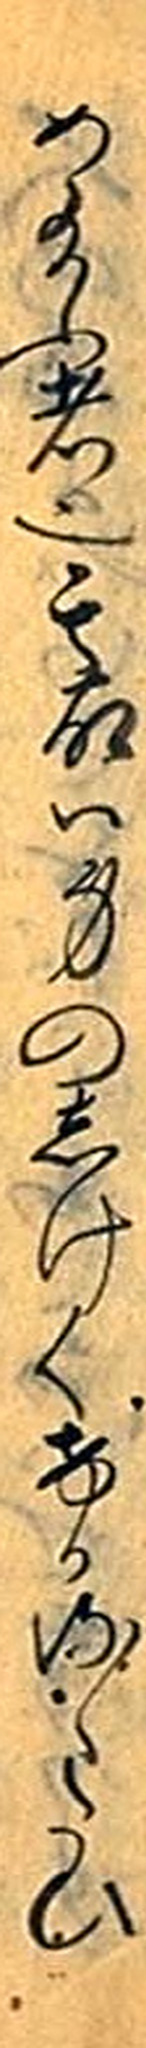め給ふ者也其故は身のしけくけかるゝたひ
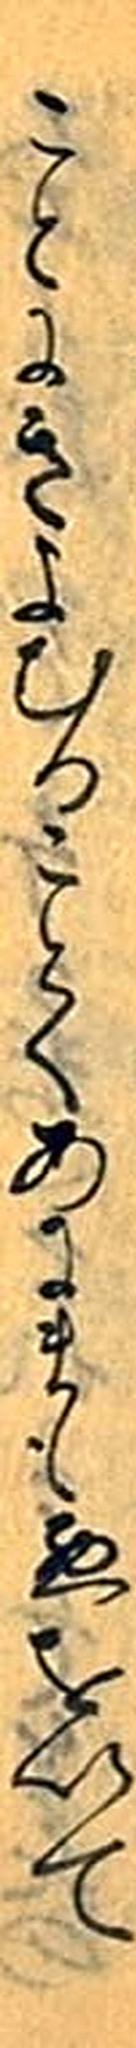ことにきよむることくあにまも悪を以て
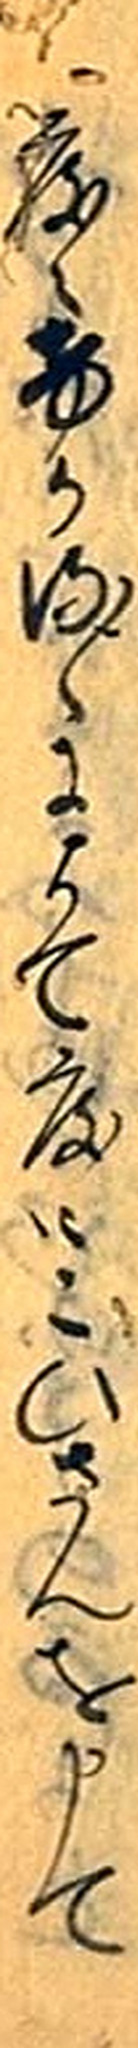度々けかるゝによて度々こひさんを申て
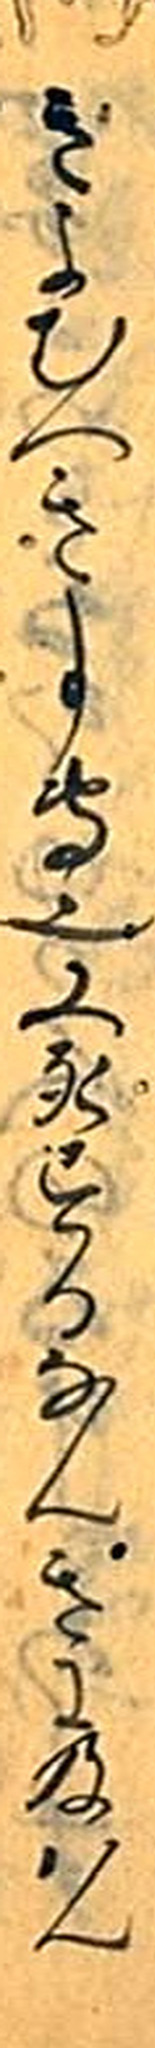きよむへき事専也又死するなんきに及はん
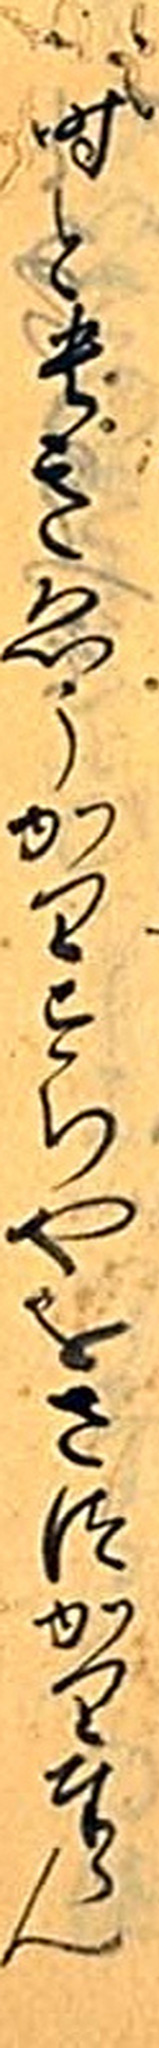時と貴きゑうかりすちやをさつかり奉らん
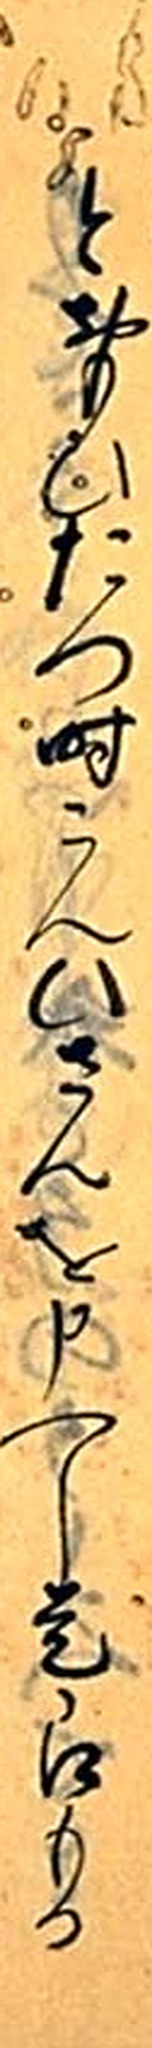とおもひたつ時こんひさんを申へし是即もる
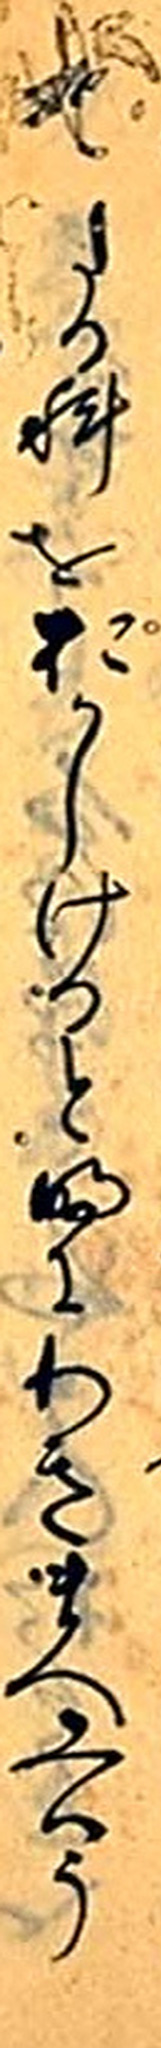たる科をおかしけると明にわきまへ又はう
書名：ドチリナ・キリシタン
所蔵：東京大学総合図書館 / General Library in the University of Tokyo
